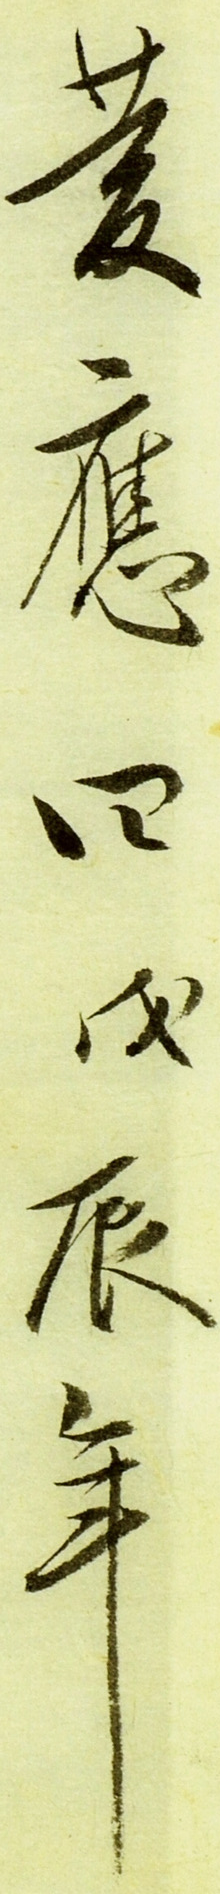慶応四戊辰年
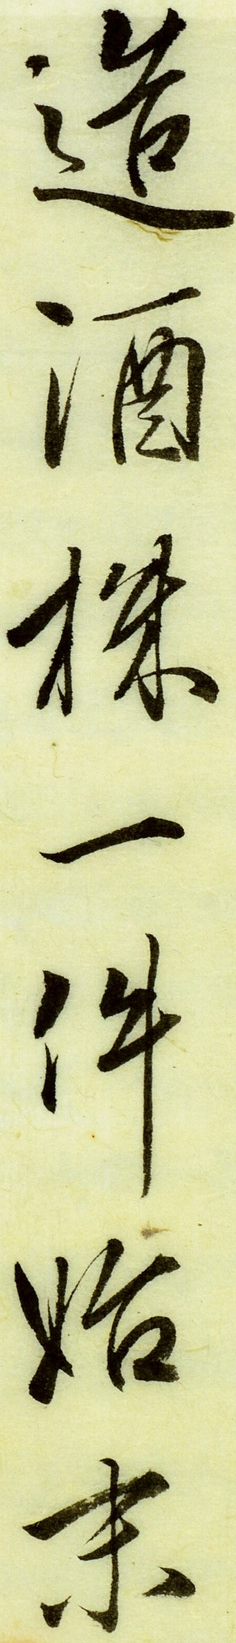造酒株一件始末
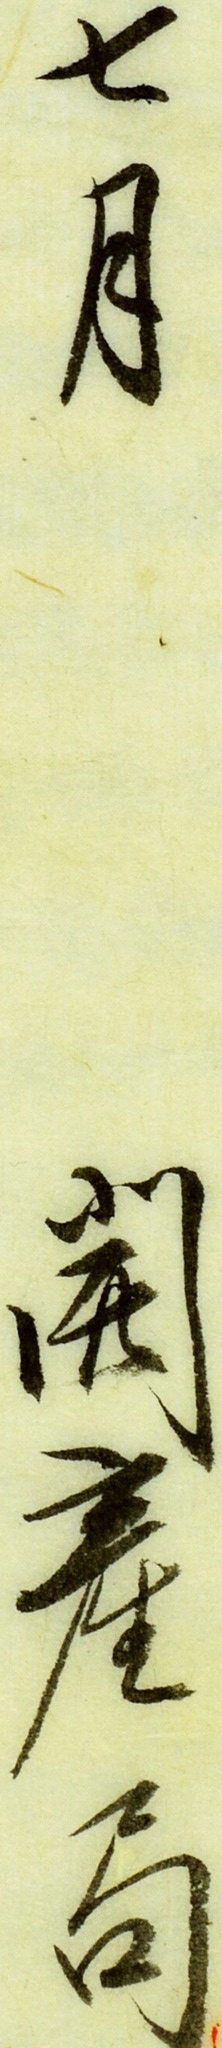七月開産局

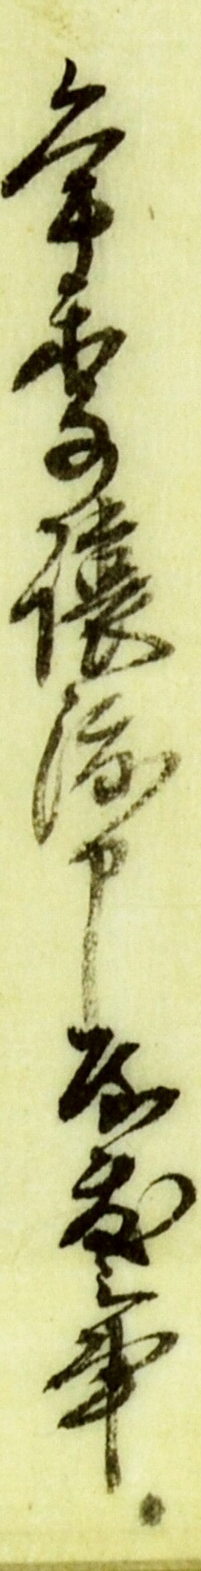年季譲渡申屋敷之事
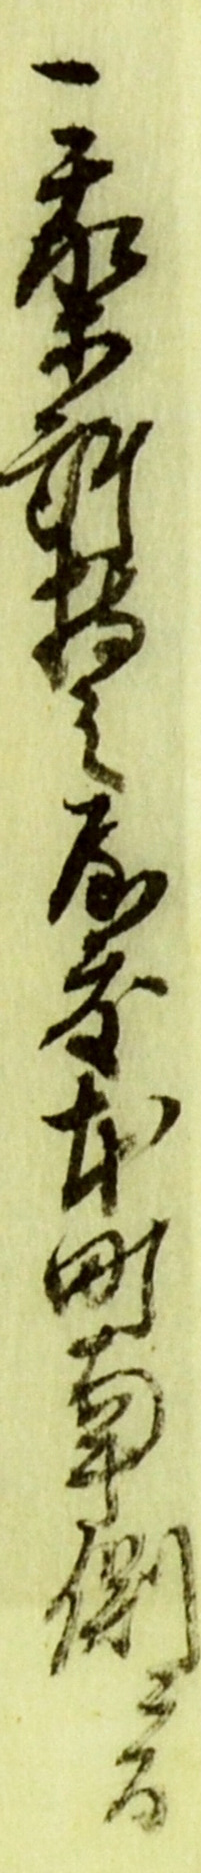一我等所持之屋敷本町南側二而
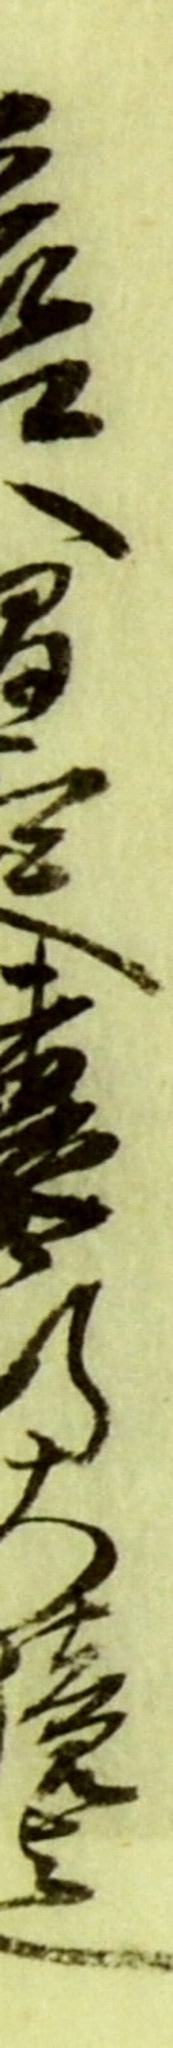表口八間三尺裏行大境迄

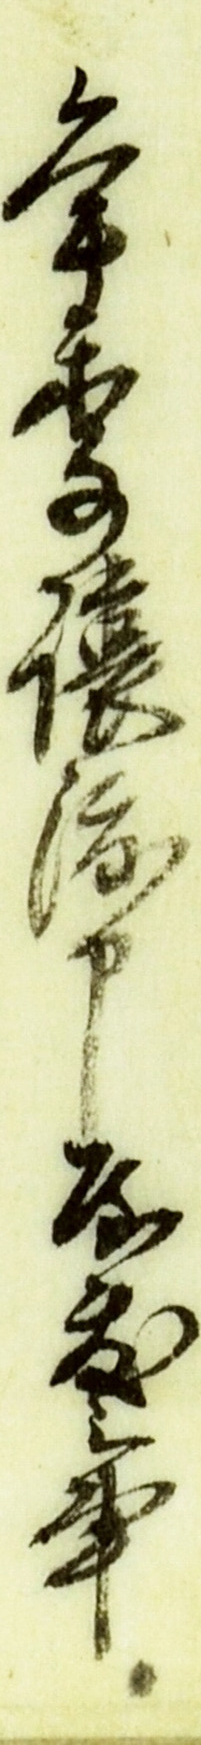年季譲渡申屋敷之事
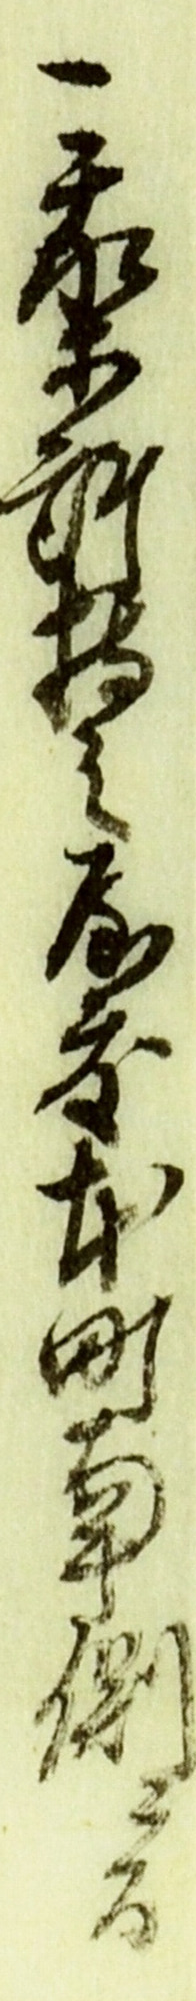一我等所持之屋敷本町南側二而
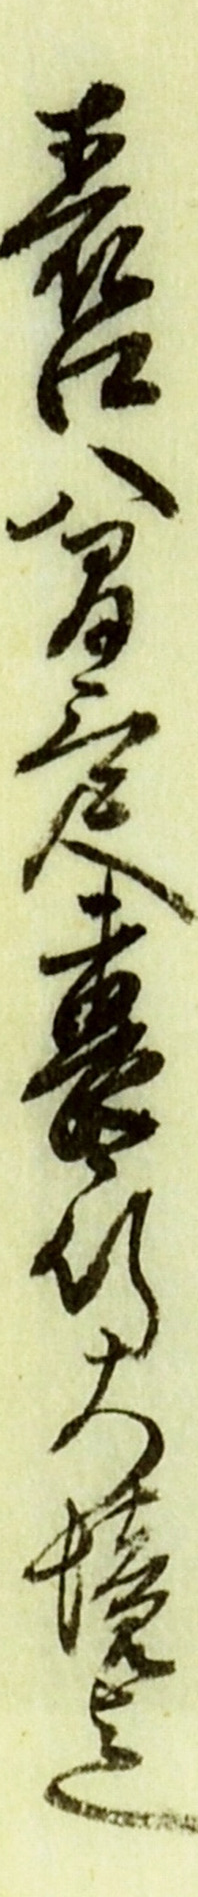表口八間三尺裏行大境迄
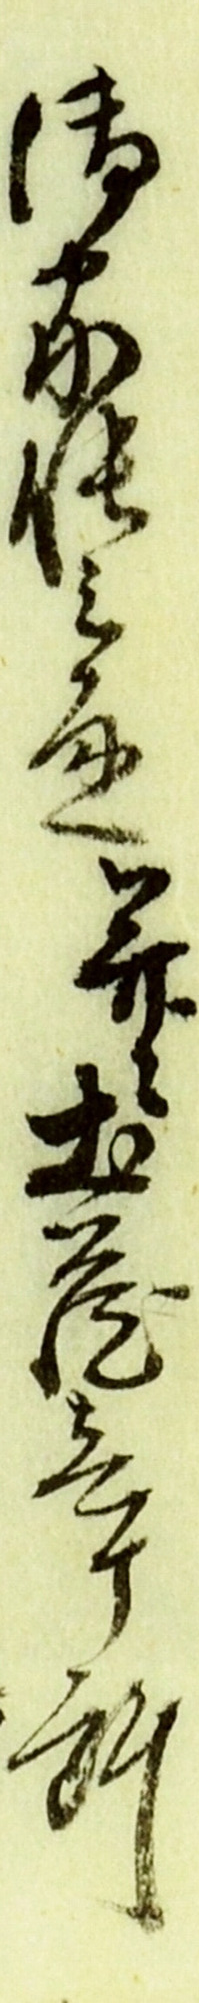御家帳之通并ニ土蔵壱ケ所
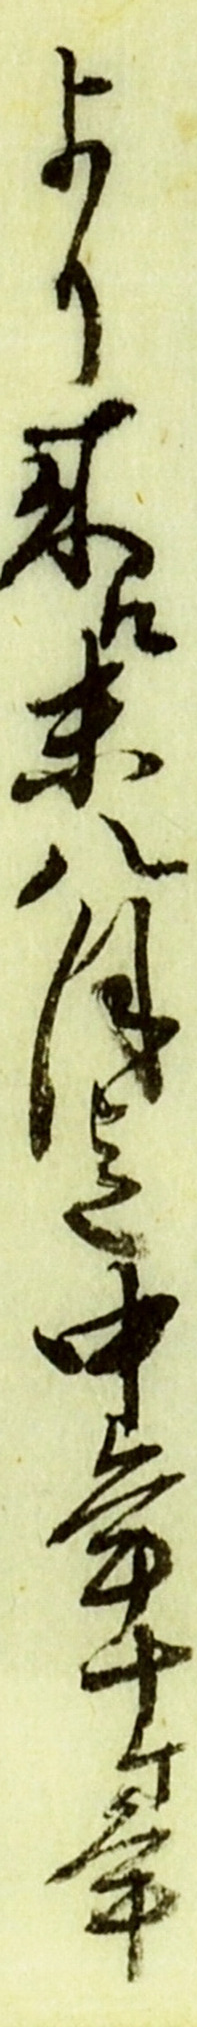より来ル未八月迄中十ケ年
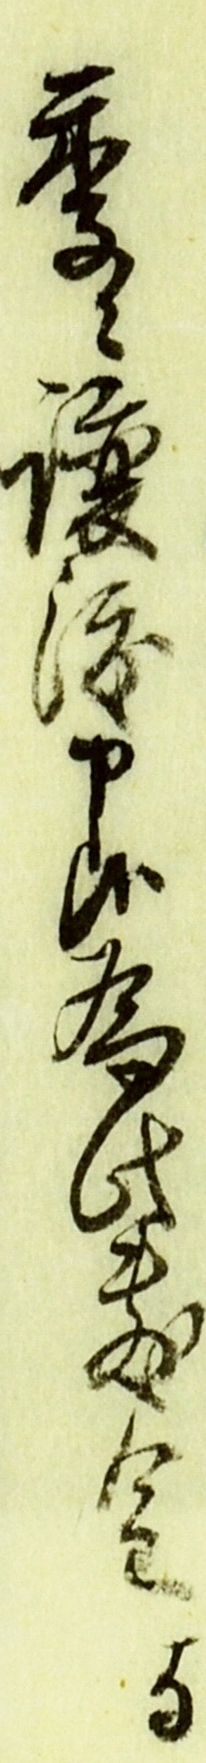季ニ譲渡申候為此敷金と
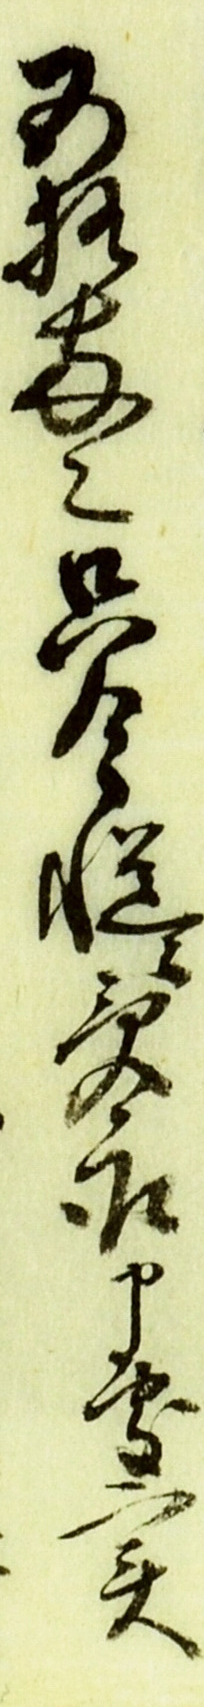五拾両也只今慥ニ受取申処実
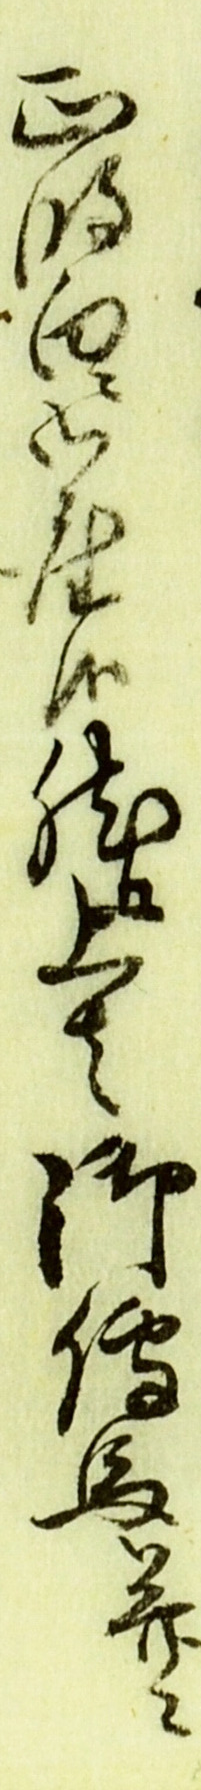正明白ニ御座候然ル上者御伝馬并ニ
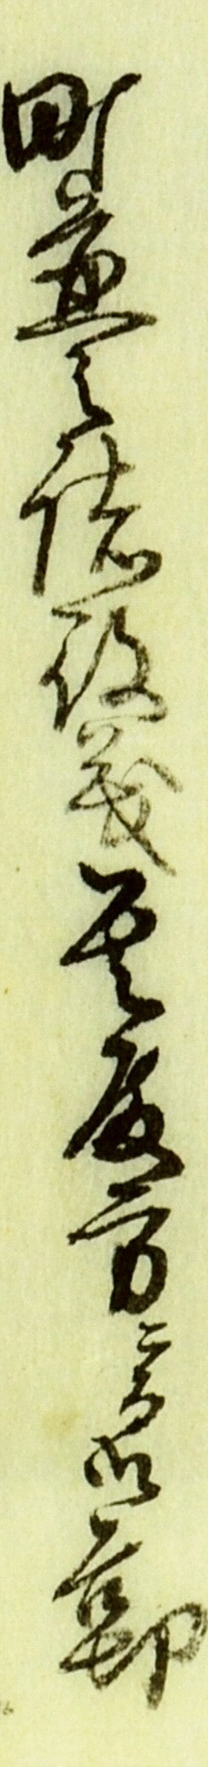町並之諸役義貴殿方二而御勤
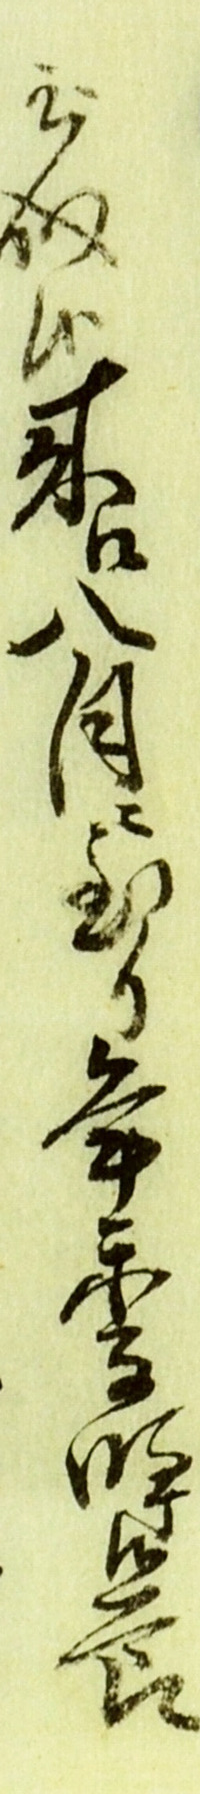被成候来ル八月ニ至り年季明ケ候節
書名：造酒株一件始末
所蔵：伊那市立高遠町図書館・合同会社AMANE
